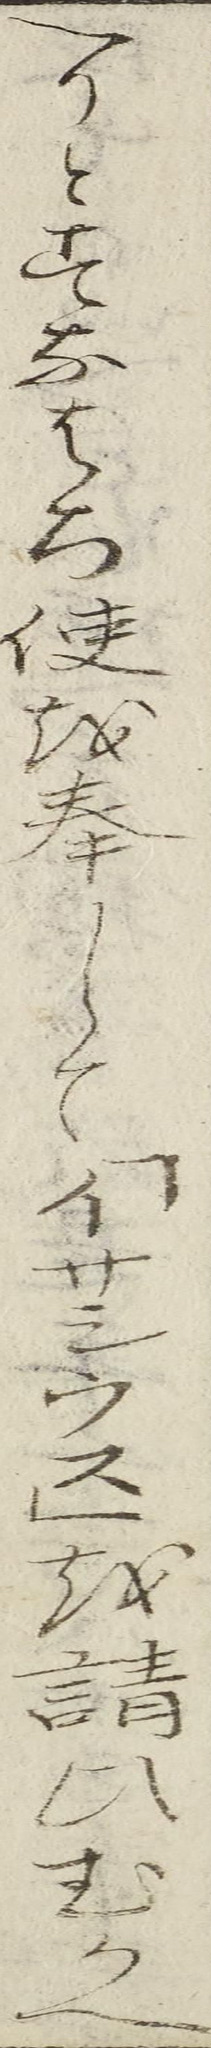たりとすなはち使うぃ奉して「イサシウス」を請ひむかへ
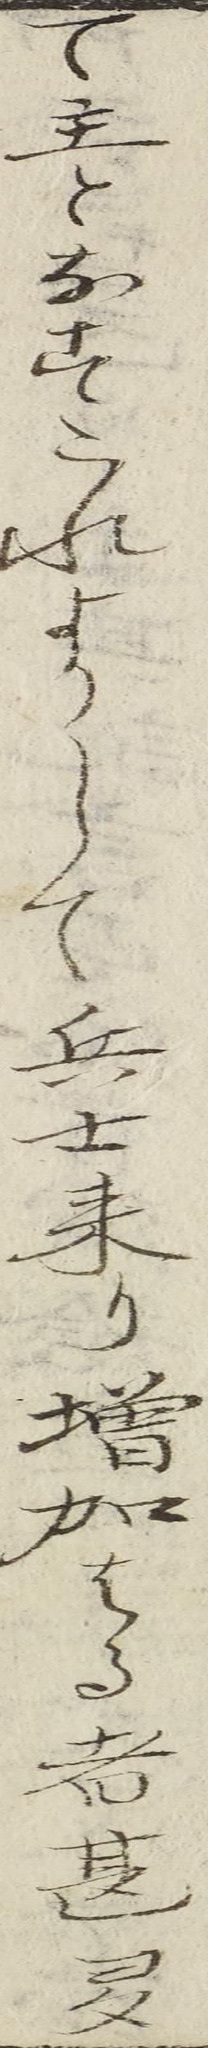て主となすこれよりして兵士来り増加はる者甚多
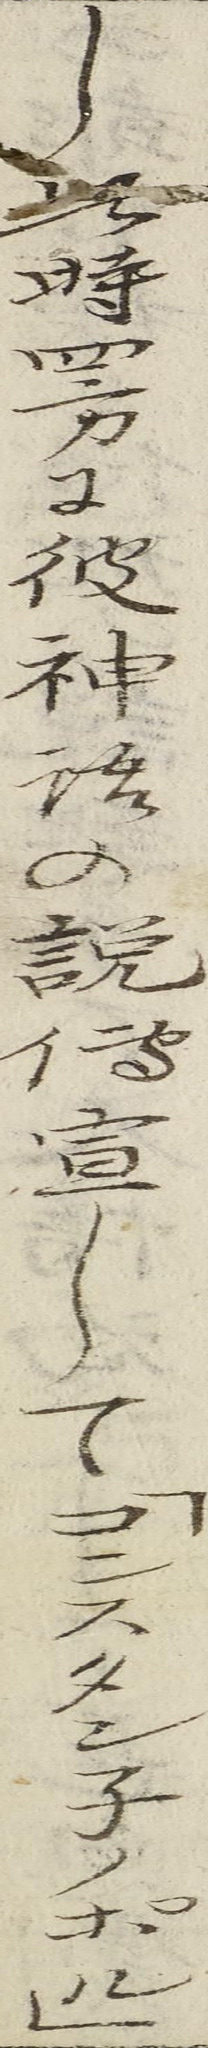し此時四方に彼神語の説伝宜して「コンスタン子ノポル」

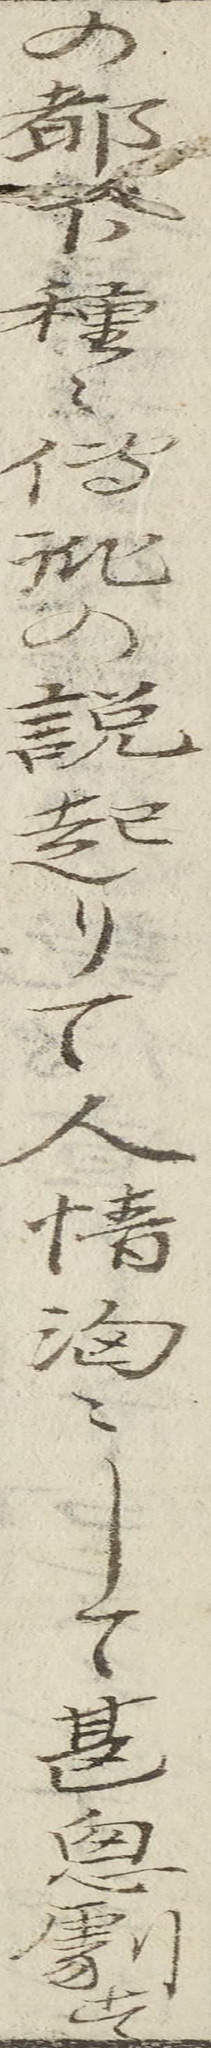の都下種々の伝記の説起りて人情洵々して甚恖剽す
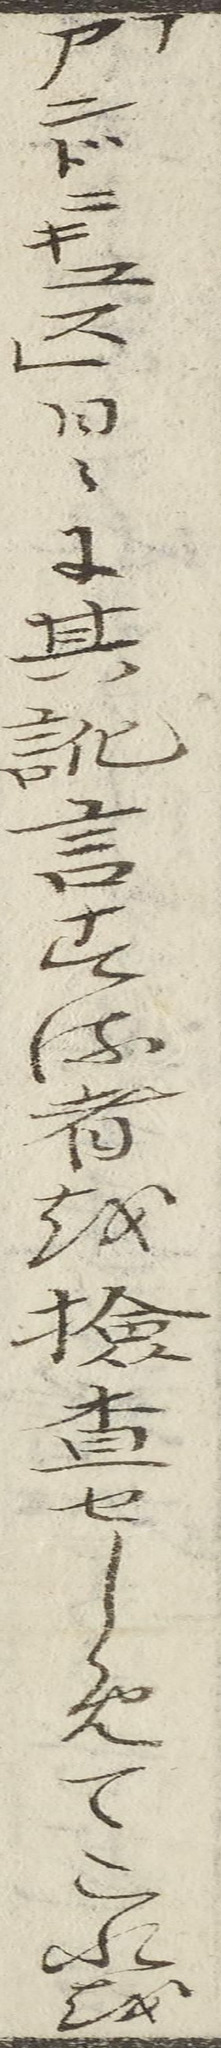「アンド二キュス」日々に其訛言する者を検査せしめてこれを
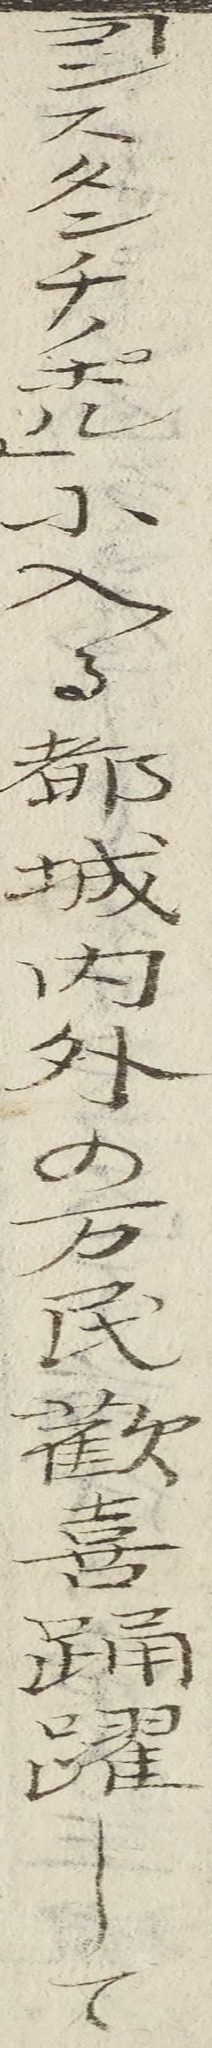「コンスタンチノポル」に入る都城内外の万民歓喜躍躍して
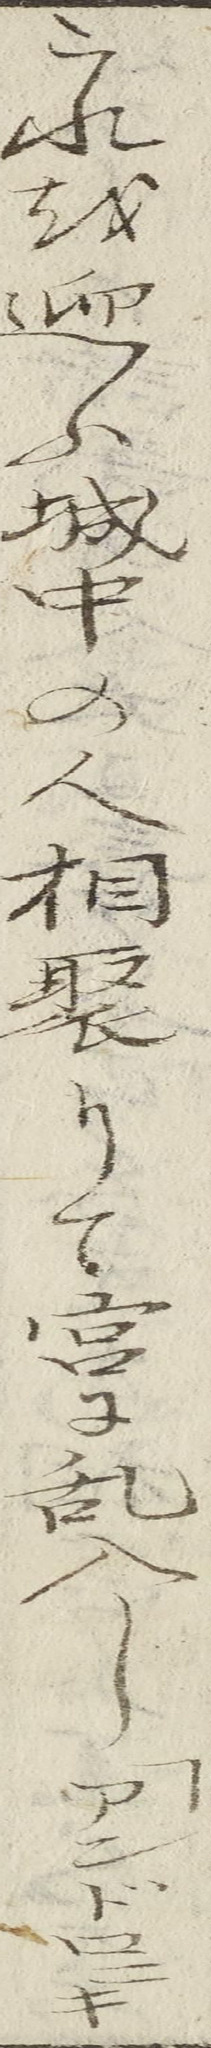これを迎ふ城中の人相聚りて宮に乱入し「アンドロ二キ
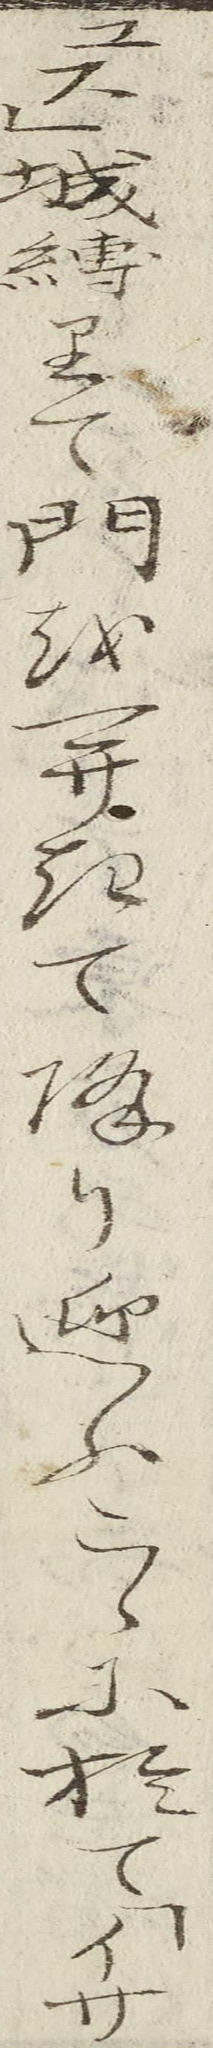ュス」城縛りて門を開きて降り迎ふこゝに於て「イサ
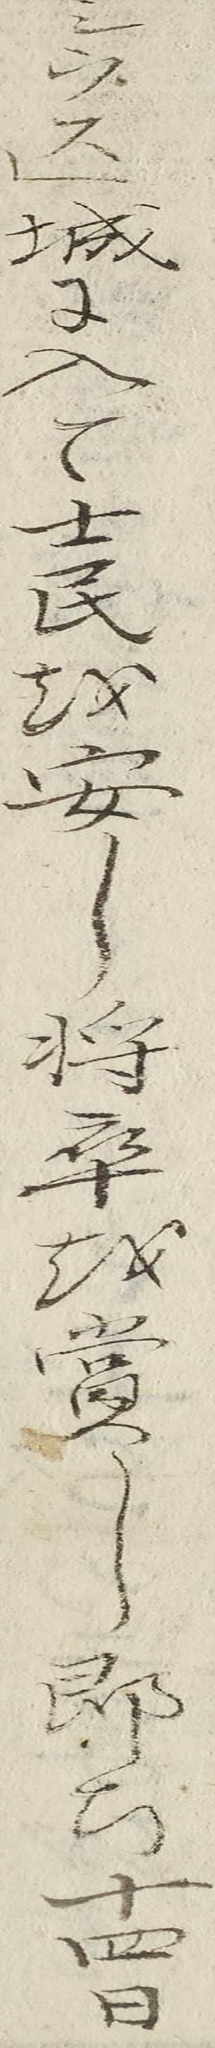シウス」城に入て士民を安し将卒を賞し即ち十四日
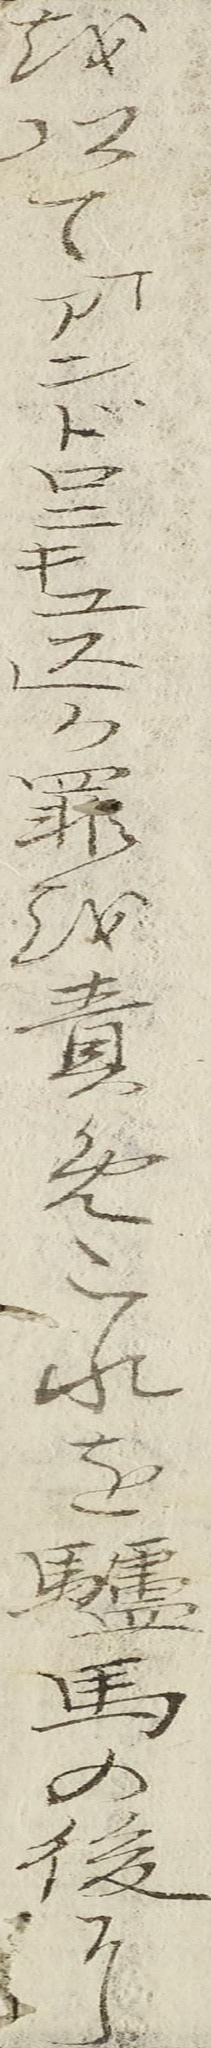を以て「アンドロ二キュス」か罪を責めこれを驢馬の後に
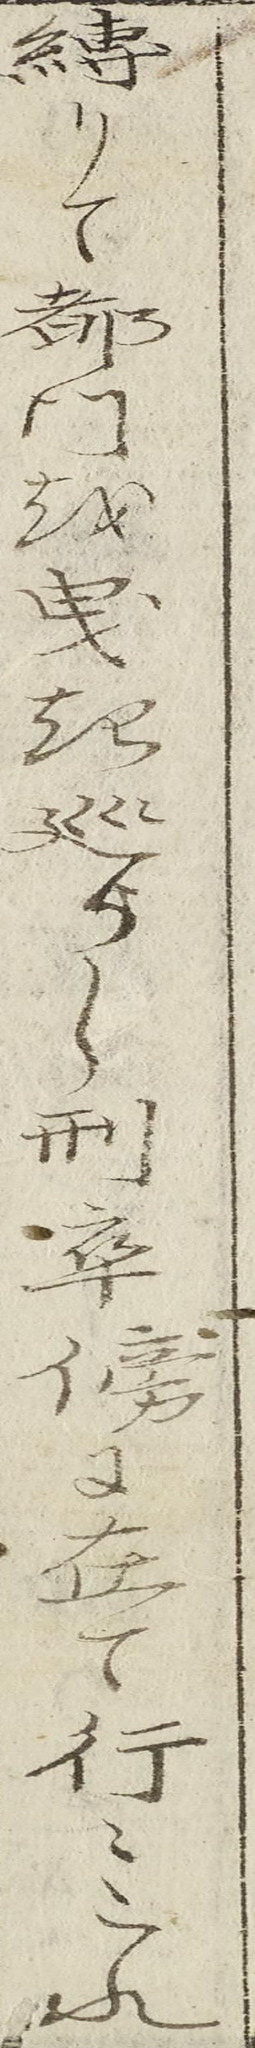縛りて都内を曳き巡りし刑卒傍に在て行々これ
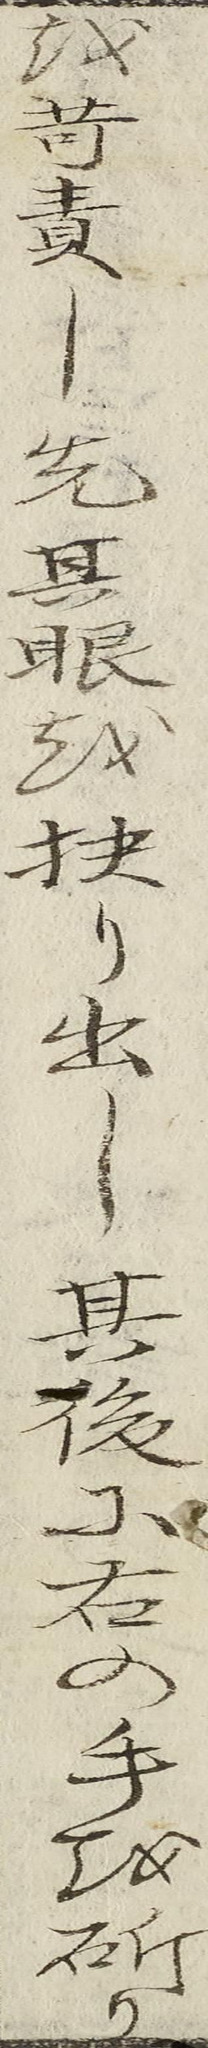を苛責し先其眼を抉り出し其後に右の手を斫り
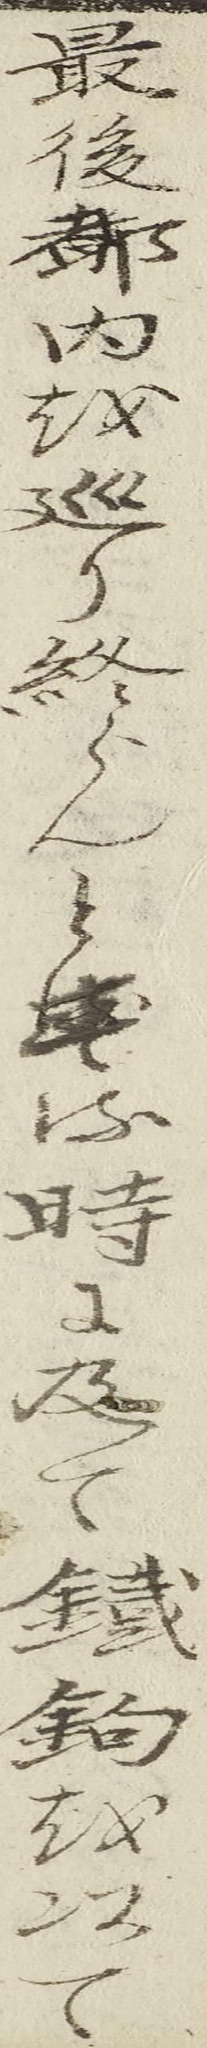最後都内を巡り終らんとする時に及て鉄釣を以て
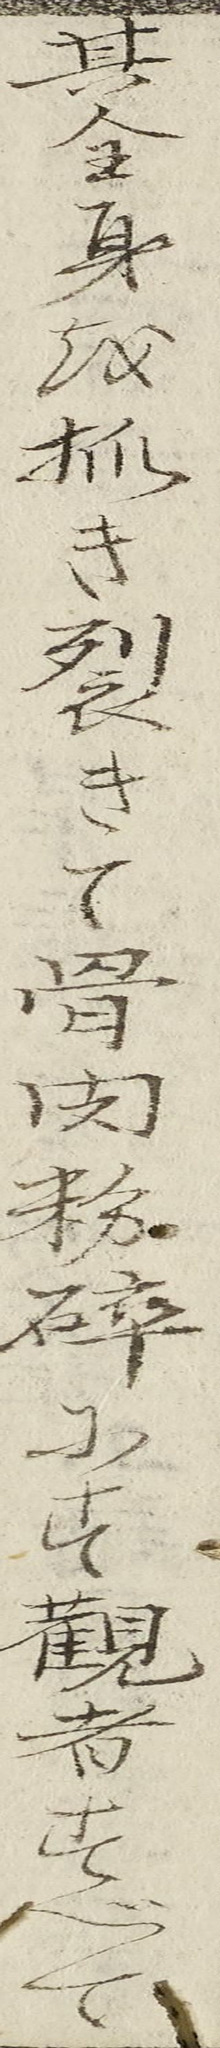其全身を柧き裂きて骨肉粉砕にす観者すべて
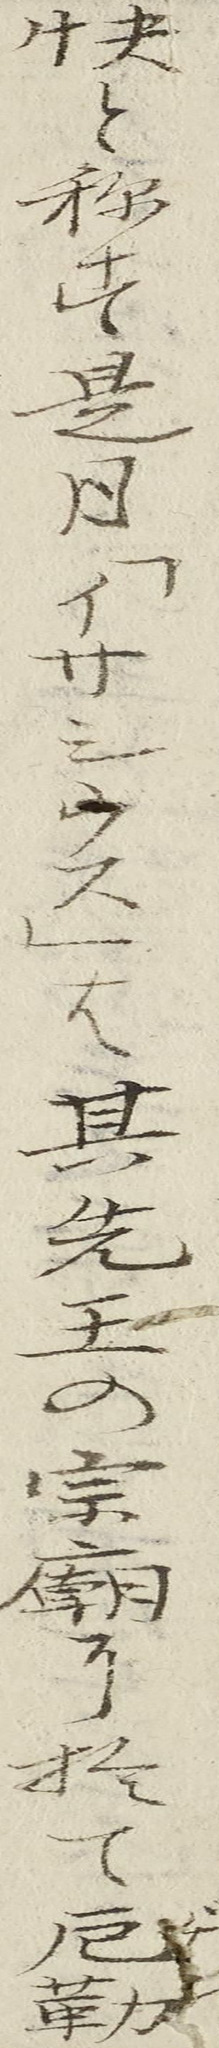快と称す是日「イサシウス」は其先王の宗廟に於て厄勒
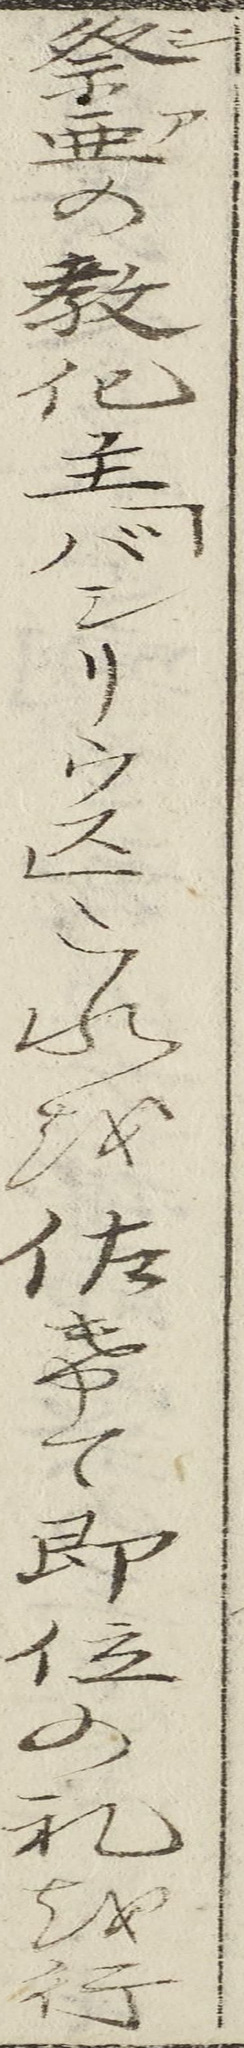祭亜の教化主「バシリウス」これをさけて即位の礼を行
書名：西洋雜記　乾
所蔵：東京大学地震研究所図書室 Earthquake Research Institute Library, The University of Tokyo, JAPAN
